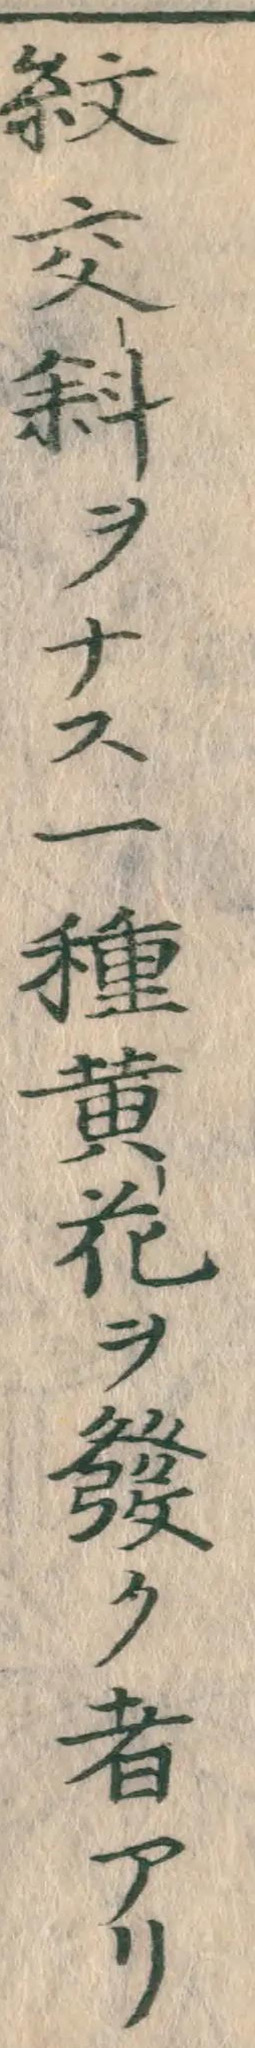紋交-斜ヲナス一種黄-花ヲ発ク者アリ

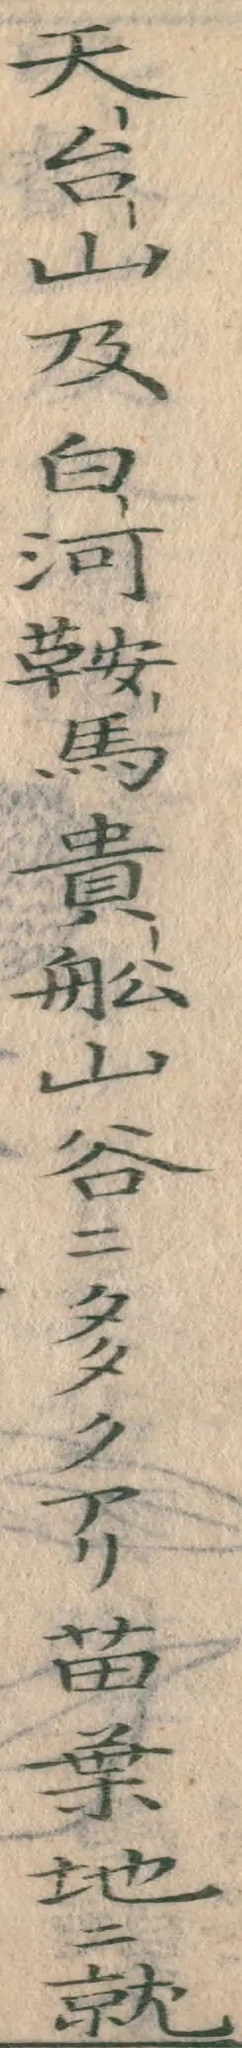天-台-山及白-河鞍-馬貴-船山谷ニ多クアリ苗葉地ニ就
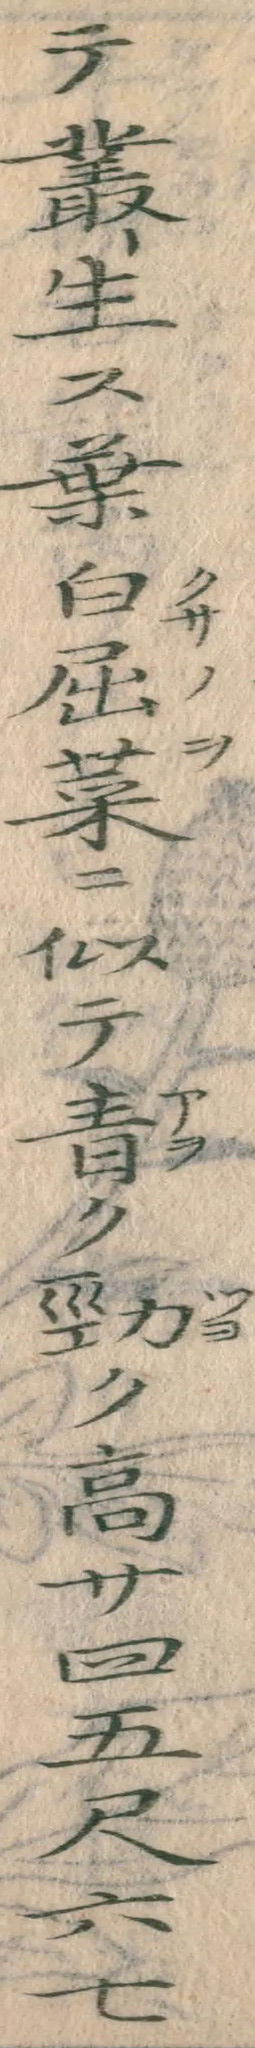テ叢-生ス葉白屈菜ニ似テ青ク勁ク高サ四五尺六七
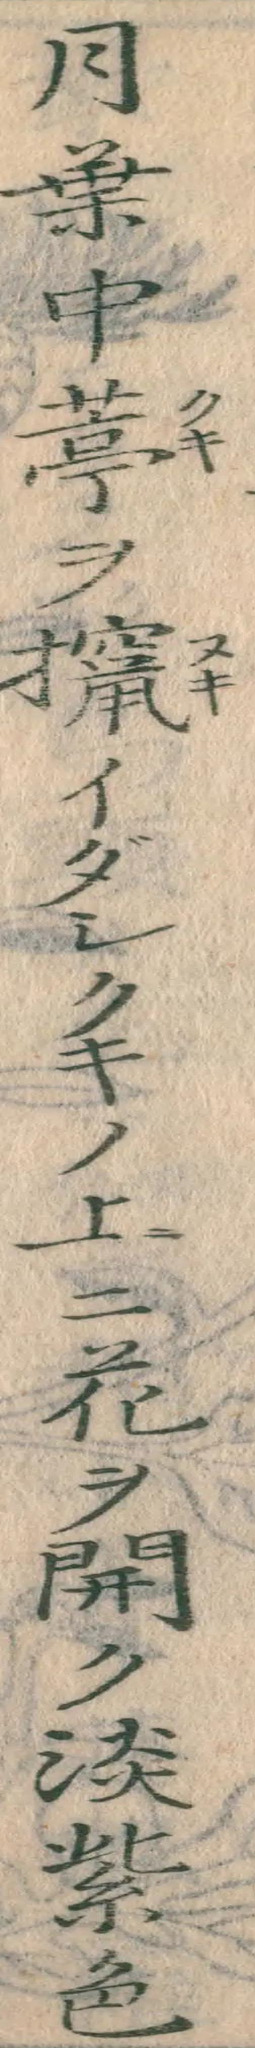月葉中葶ヲ攛イダシクキノ上ニ花ヲ開ク淡紫色
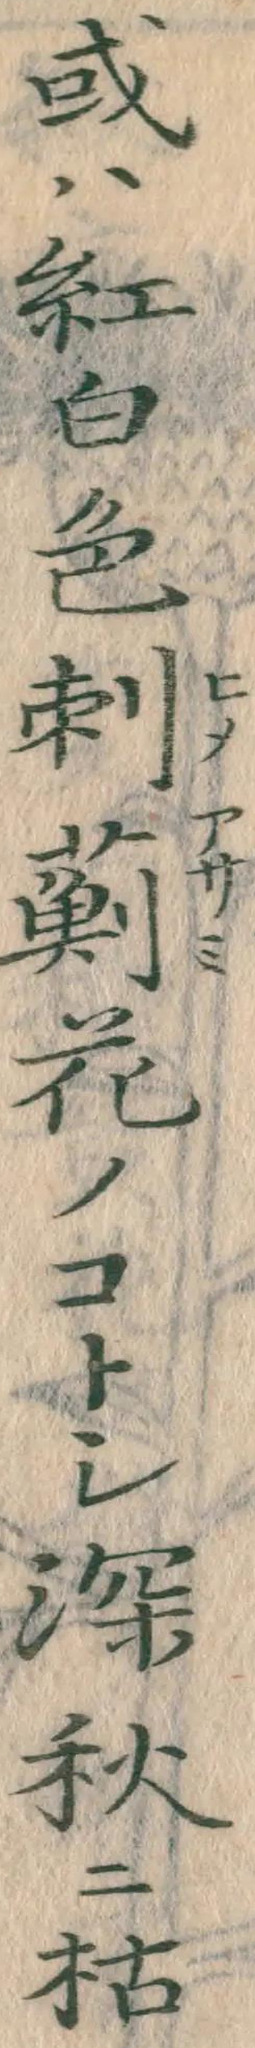或ハ紅白色刺薊花ノコトシ深秋ニ枯

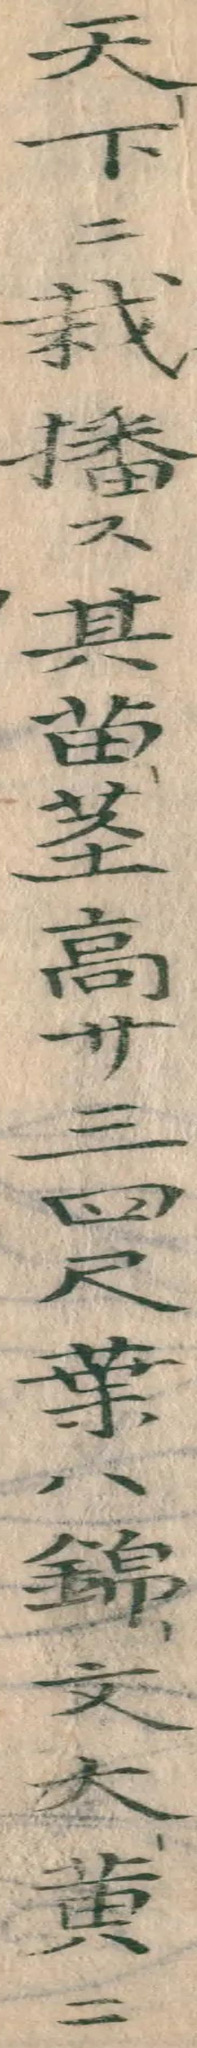天-下ニ栽播ス其苗-茎高サ三四尺葉ハ錦-文大-黄ニ
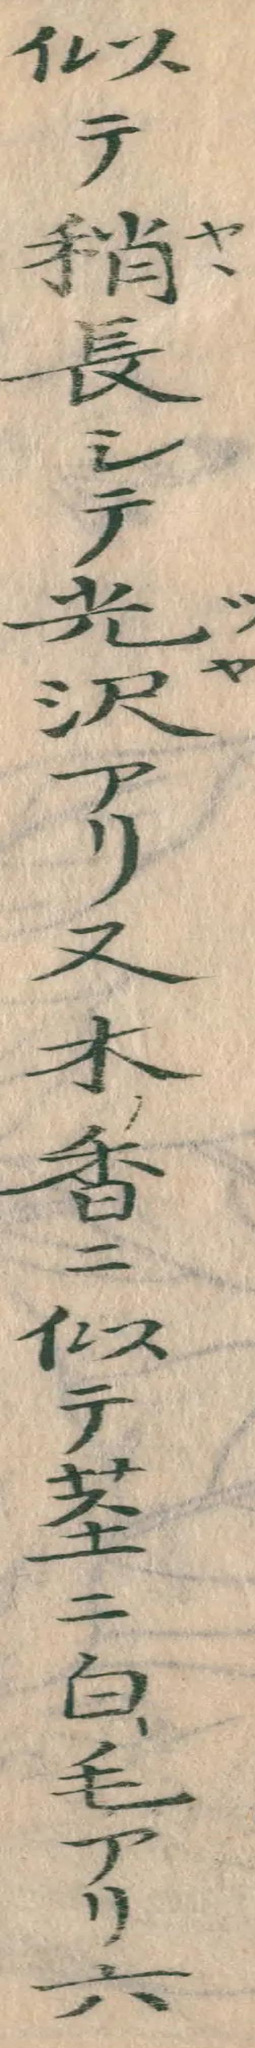似テ稍長シテ光沢アリ又木-香ニ似テ茎ニ白-毛アリ六
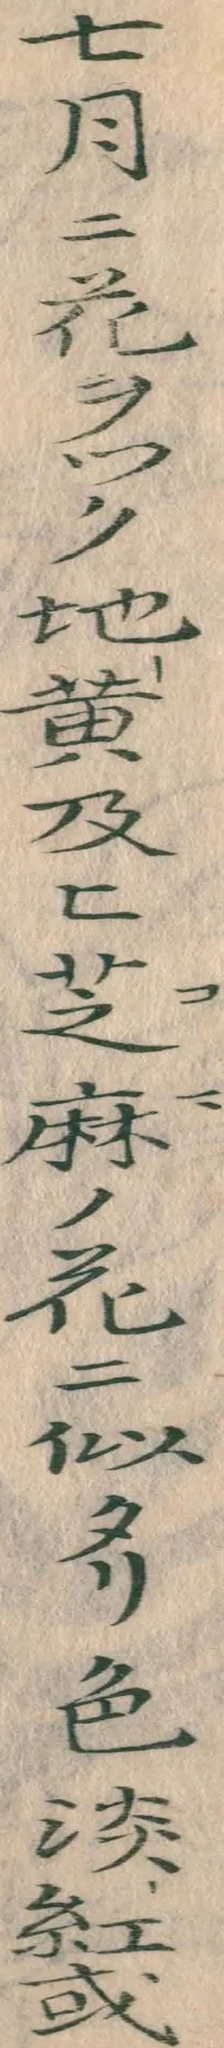七月ニ花ヲツク地-黄及ヒ芝麻ノ花ニ似タリ色淡-紅或
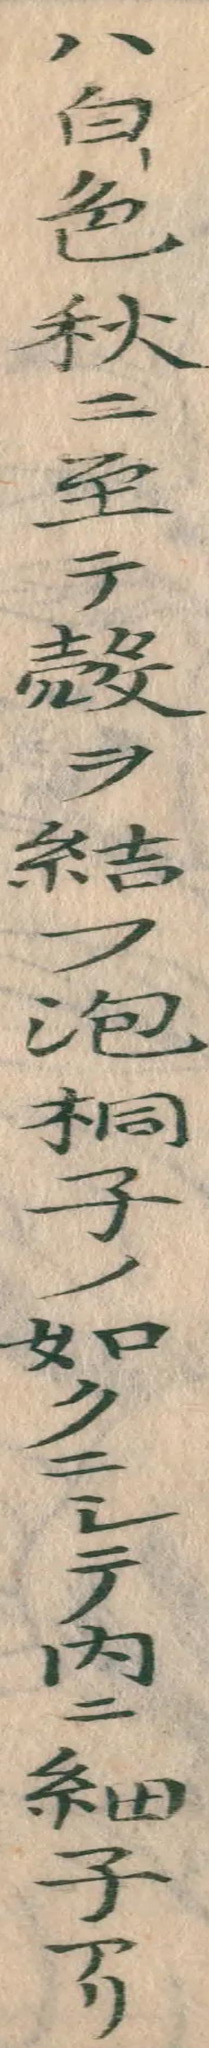ハ白-色秋ニ至テ殻ヲ結フ泡桐子ノ如クニシテ内ニ細子アリ
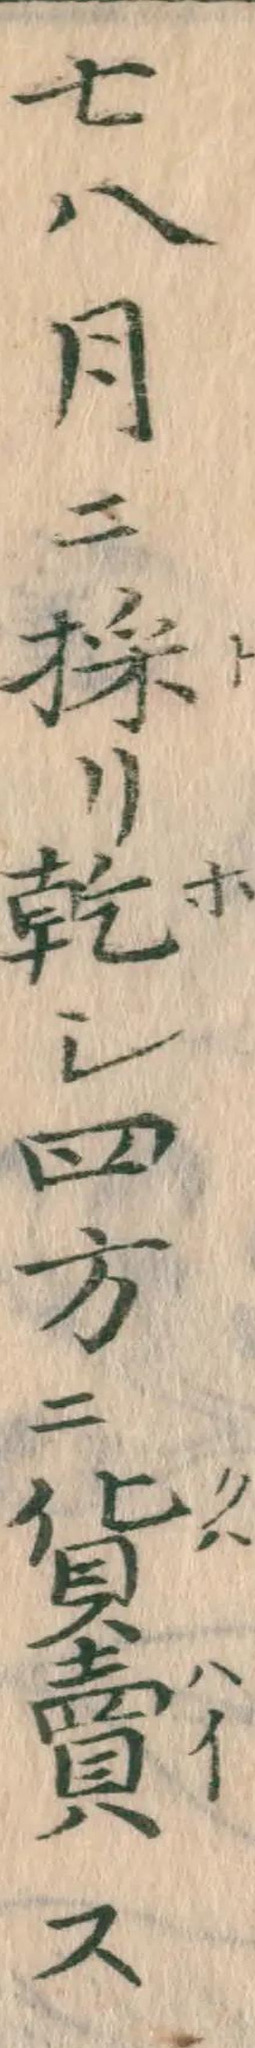七八月ニ採リ乾シ四方ニ貨売ス

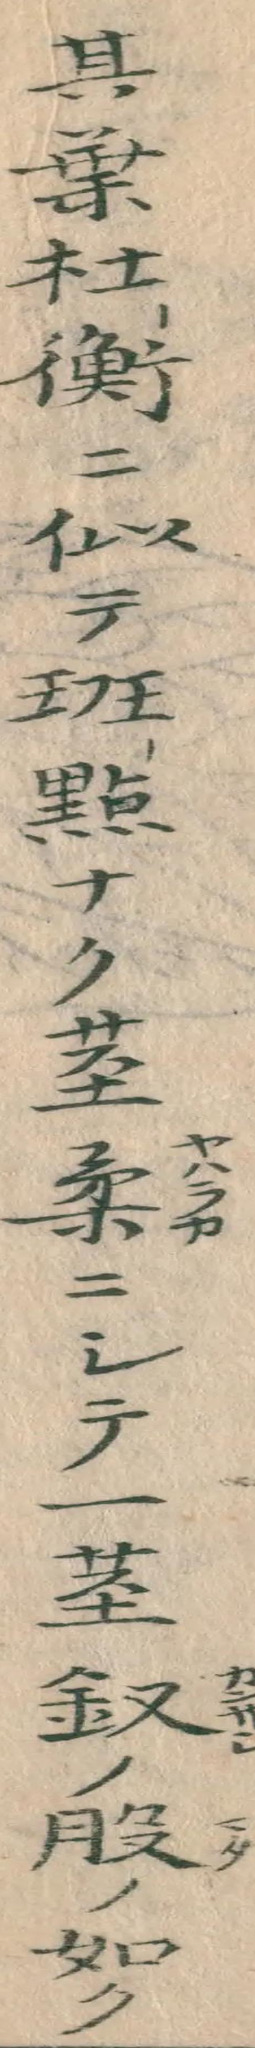其葉杜-衡ニ似テ斑-点ナク茎柔ニシテ一茎釵ノ股ノ如ク
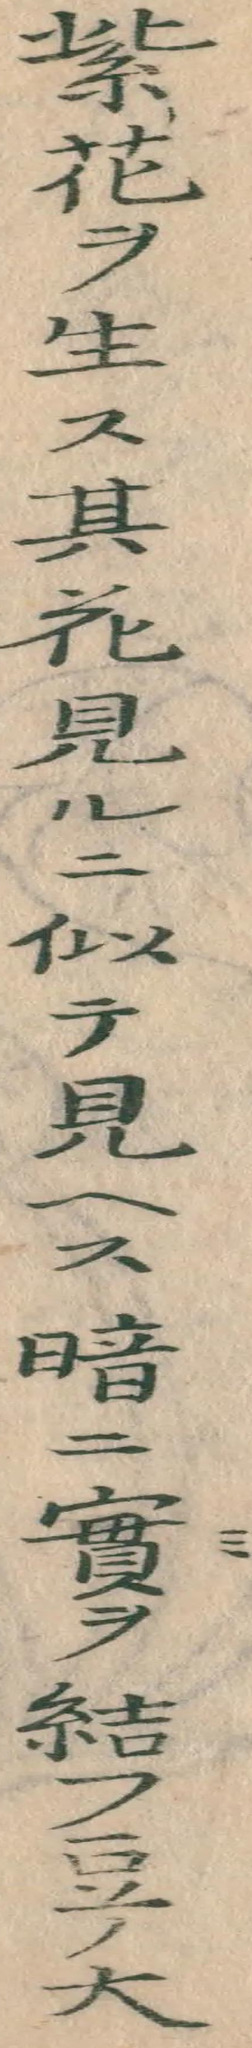紫-花ヲ生ス其花見ルニ似テ見ヘス暗ニ実ヲ結フ豆ノ大
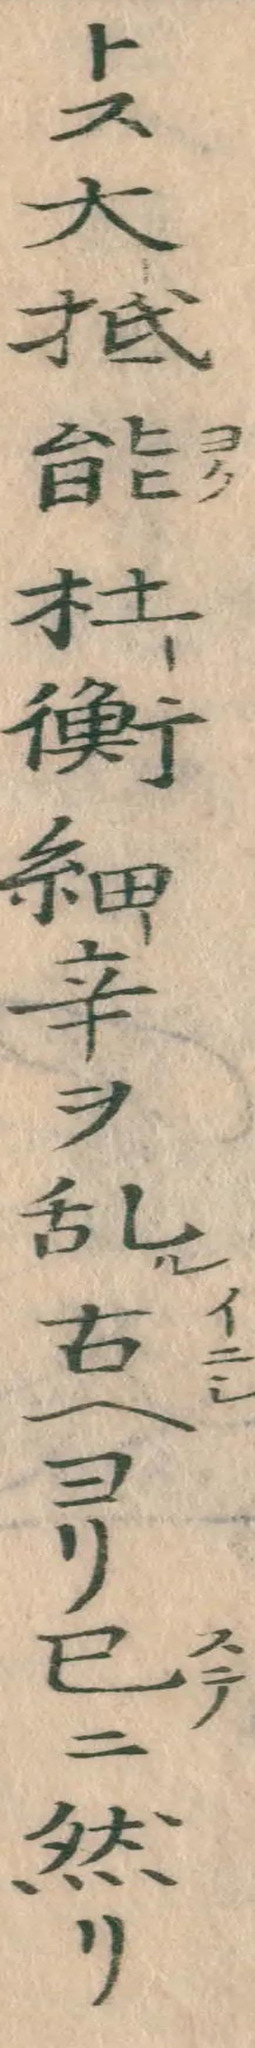トス大-抵能杜-衡細-辛ヲ乱古ヘヨリ巳ニ然リ

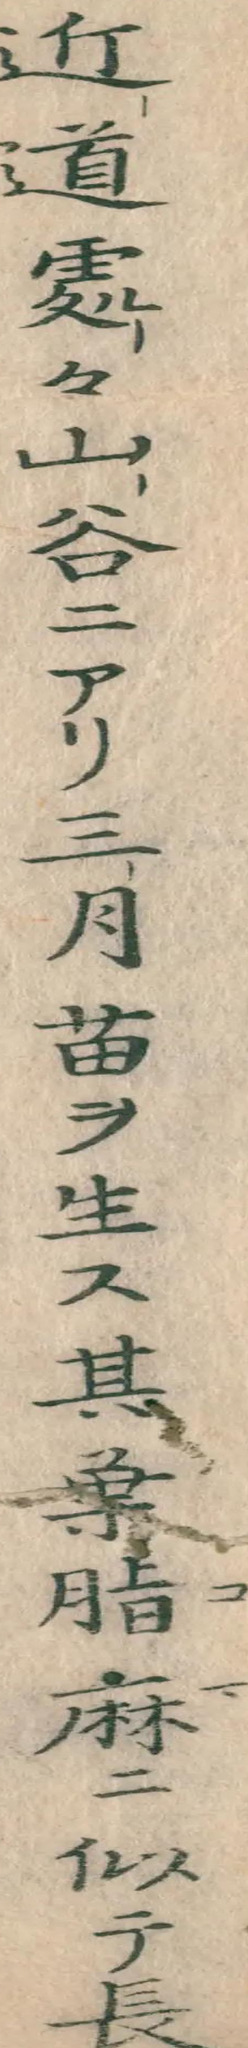近-道処-々山-谷ニアリ三-月苗ヲ生ス其葉脂麻ニ似テ長
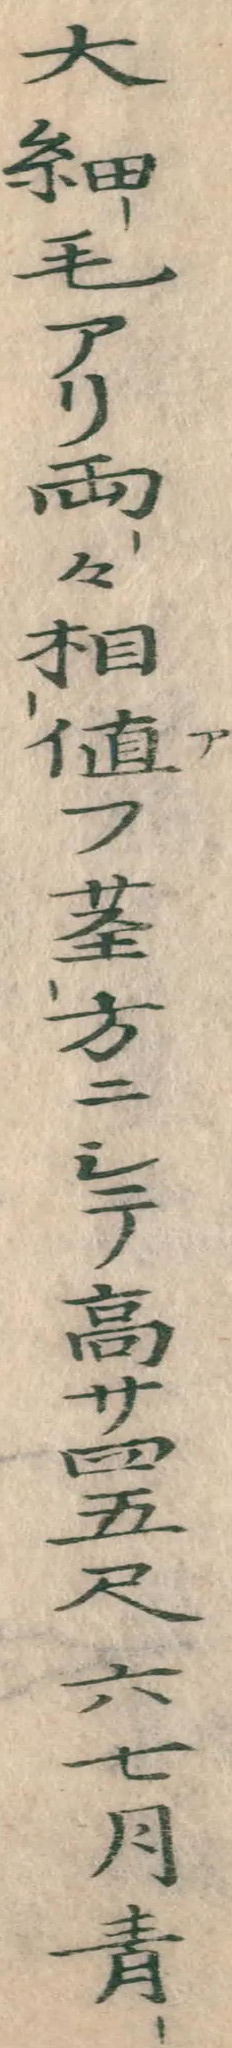大細-毛アリ両-々相-値フ茎-方ニシテ高サ四五尺六七月青-
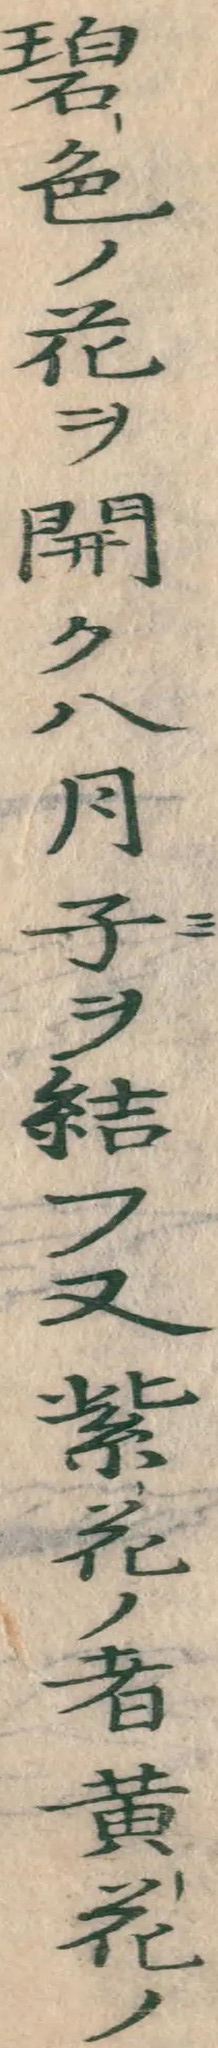碧-色ノ花ヲ開ク八月子ヲ結フ又紫-花ノ者黄-花ノ
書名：花彙 草部4巻木部4巻. [1]
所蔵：国立国会図書館 National Diet Library, JAPAN
